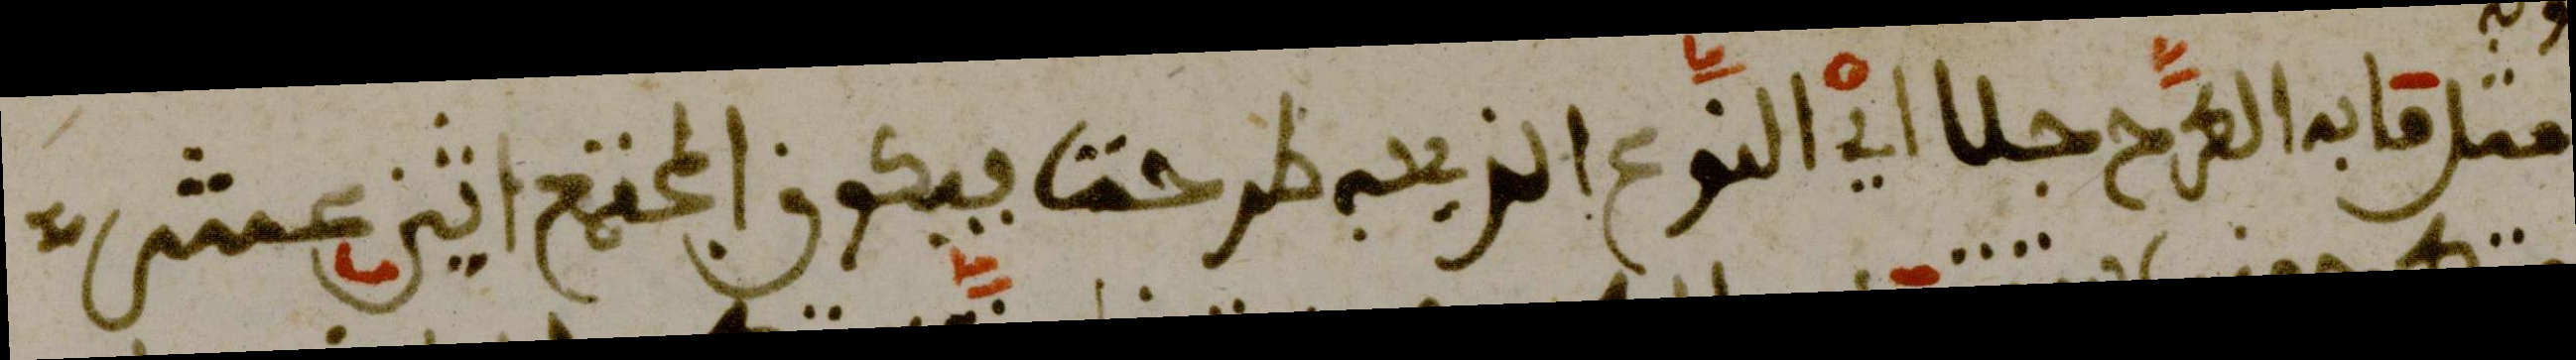مثل ما به الطرح جلا اي النّوع الذي به طرحت فيكون المجتمع اثنى عشر
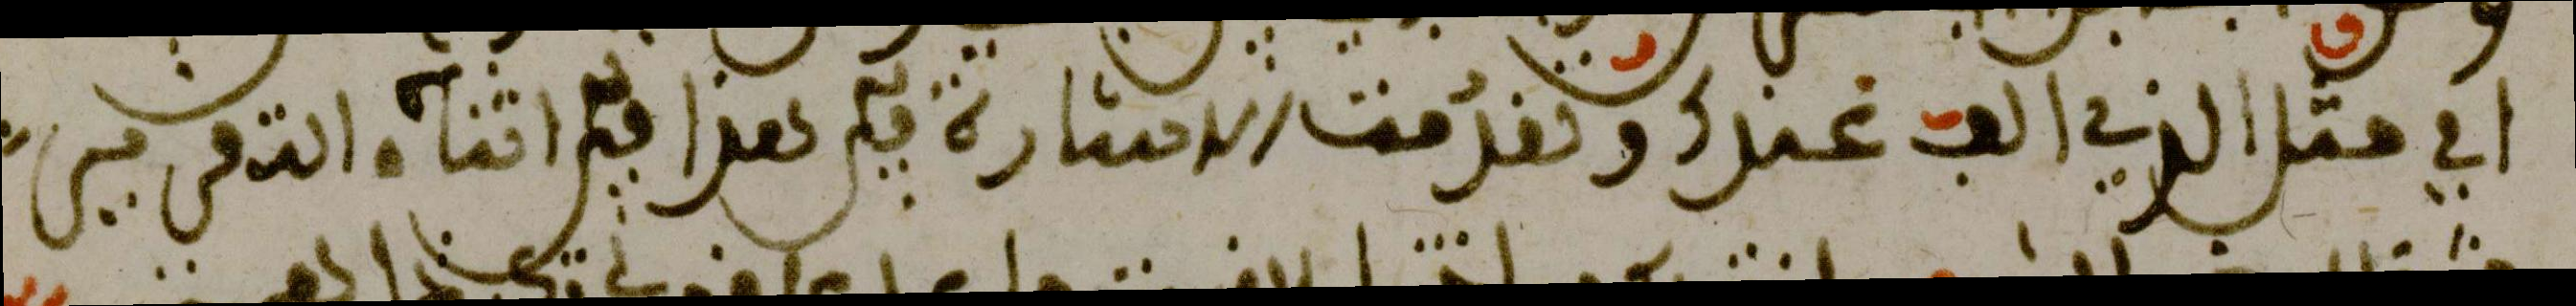اي مثل الذي الف عندك و تقدمت الاشارة في هذا في اثناء التقرير
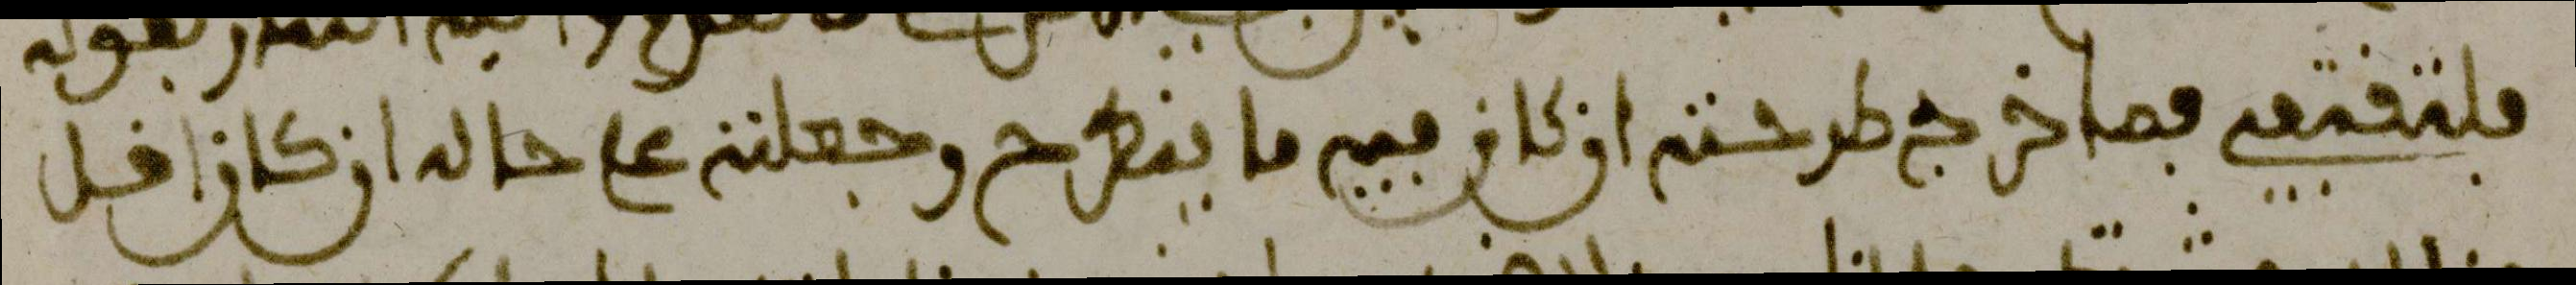فلتقتفي بما خرج طرحته ان كان فيه ما ينطرح و جعلته على حاله ان كان اقل
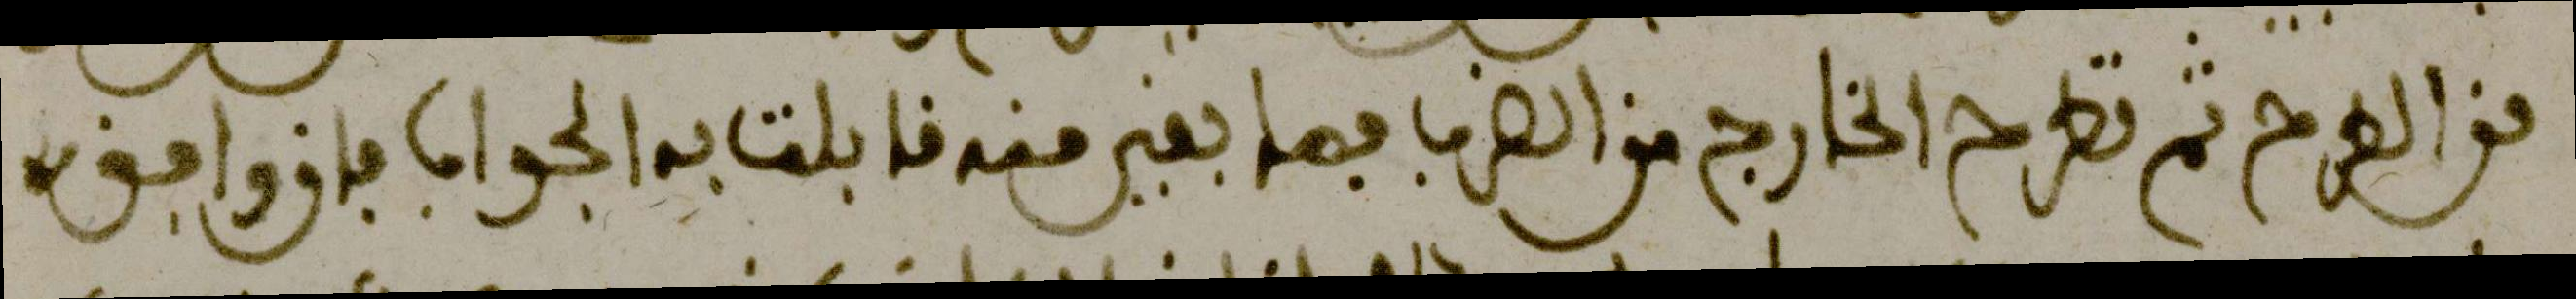من الطرح ثم تطرح الخارج من الضرب بما بقي منه قابلت به الجواب فان وافق
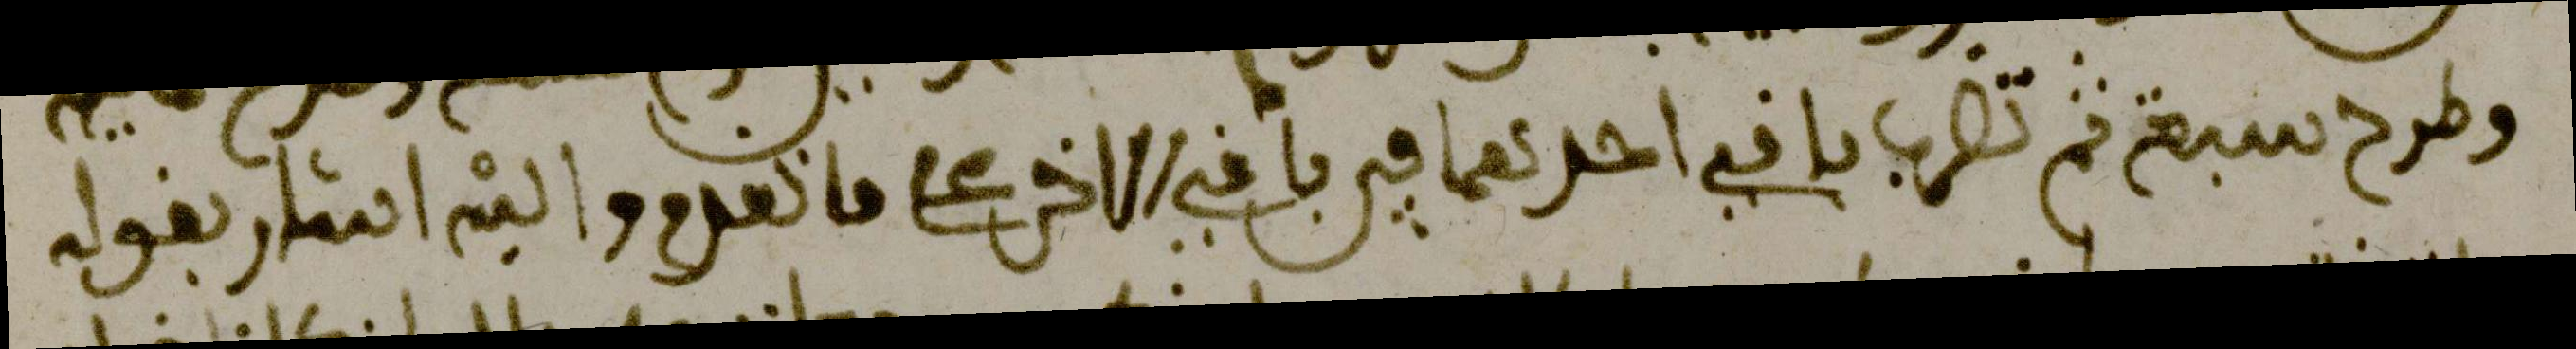وطرح سبعة ثم تضرب باقي احدهما في باقي الاخر على ما تقدم و اليه اشار بقوله
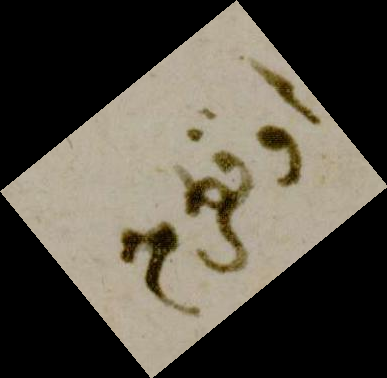او تطرح
